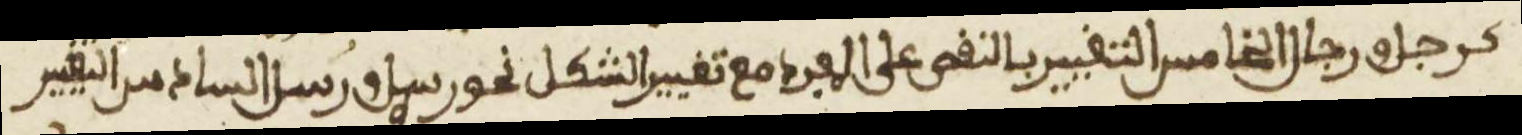كرجل و رجال الخامس التغيير بالنقص على المفرد مع تغيير الشكل نحو رسل و رسل السادس التغيير
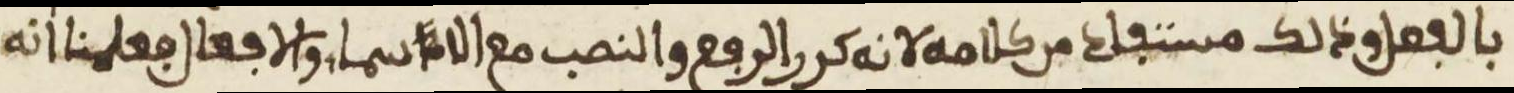بالفعل و ذلك مستفاد من كلامه لانه كرر الرفع و النصب مع الاسماء و الافعال فعلمنا انه
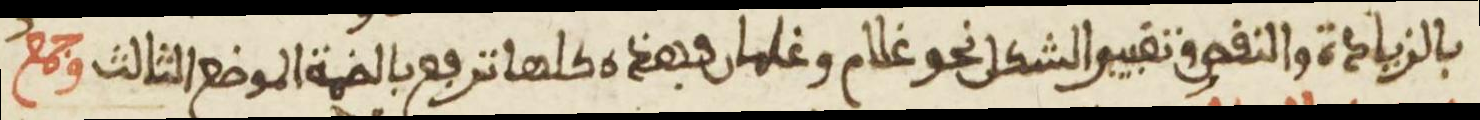بالزيادة و النقص و تغيير الشكل نحو غلام و غلمان فهذه كلها ترفع بالضمة الموضع الثالث و جمع
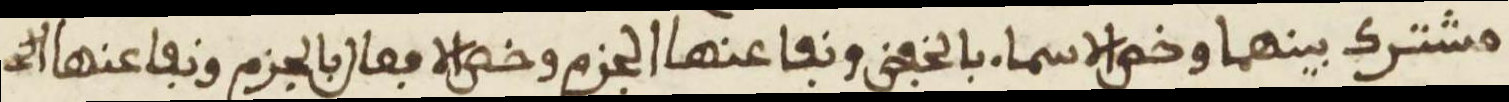مشترك بينهما و خص الاسماء بالخفض و نفا عنها الجزم و خص الافعال بالجزم و نفا عنها
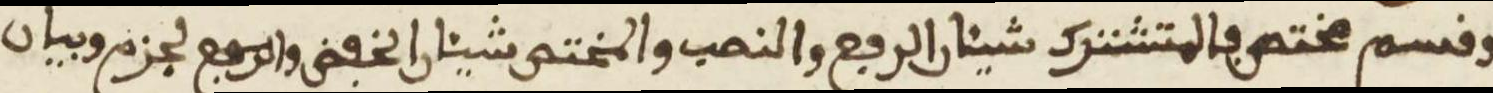و قسم مختص فالمشترك شيءان الرفع و النصب و المختص شيئان الخفض و الرفع لجزم و بيان
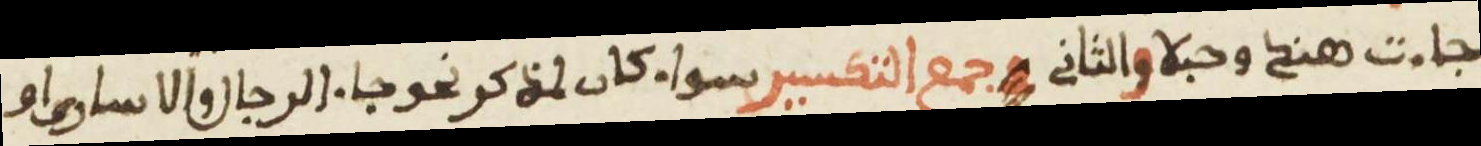جاءت هند و حبلا و الثاني جمع التكسير سواء كان لمذكر نحو جاء الرجال و الاسارى او
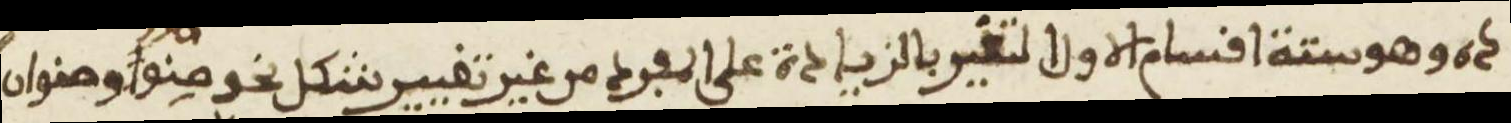ده و هو ستة اقسام الاول المتغير بالزيادة على المفرد من غير تغيير شكل نحو صنو و صنوان
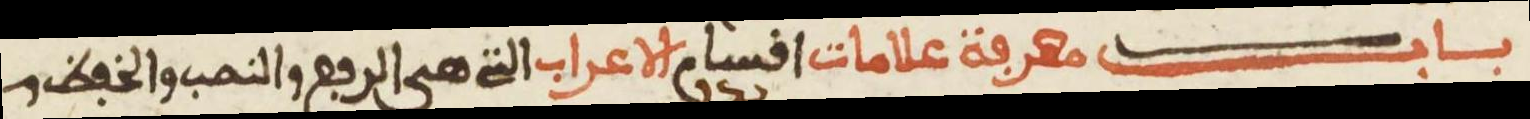باب معرفة علامات اقسام الاعرابالتي هي الرفع و النصب و الخفض
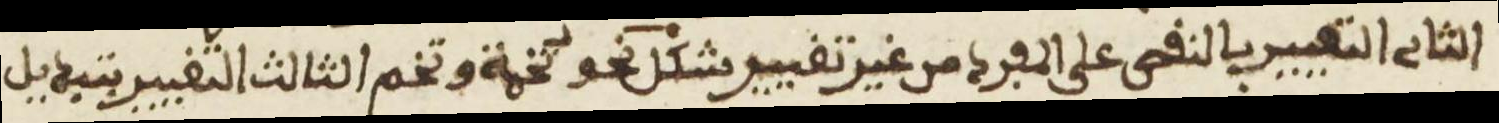الثانى التغيير بالنقص على المفرد من غير تغيير شكل نحو تخمة و تخم الثالث التغيير بتديل
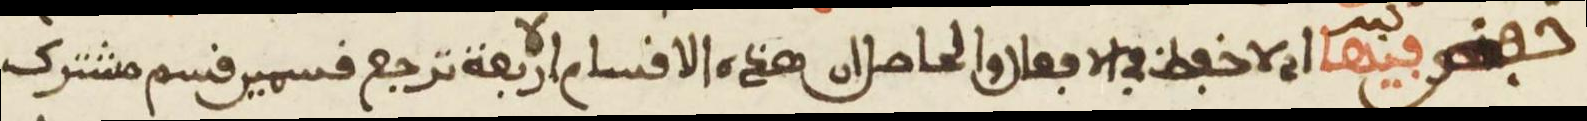خفض فيها اى لا خفظ في الافعال و الحاصل ان هذه الاقسام اربعة ترجع فسمير قسم مشترك
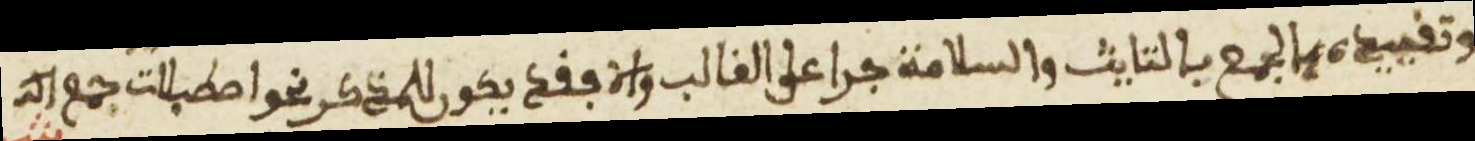و تقييد الجمع بالتايثو السلامة جرا على الغالب و الا فقد يكون للمذكر نحو اصطبلات جمع
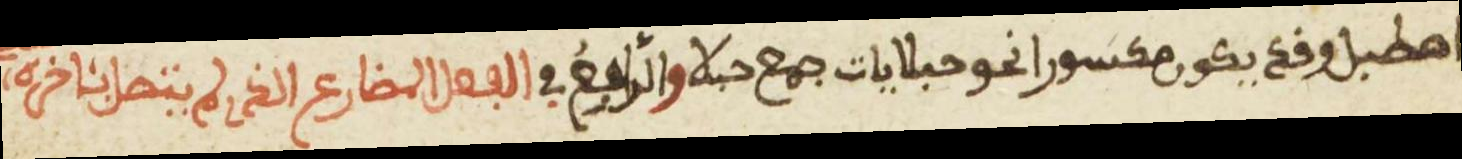اصطبل و قد يكون مكسورا نحو حبلايات جمع حبلا و الرافع في الفعل المضارع ال1ي لم يتصل بخره
